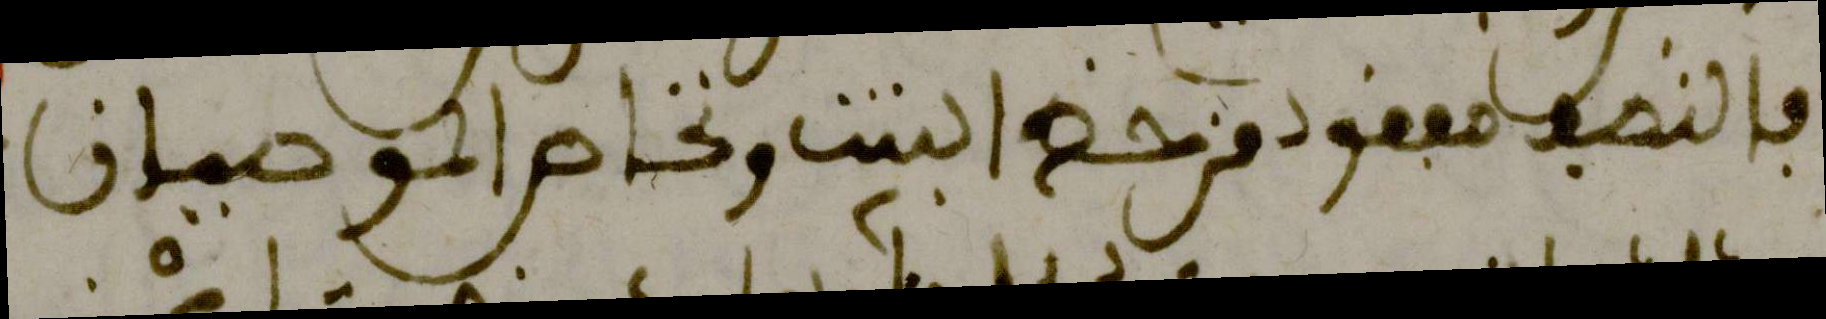فالنصف مفقود من حظ البنت وتحاص الموصيان
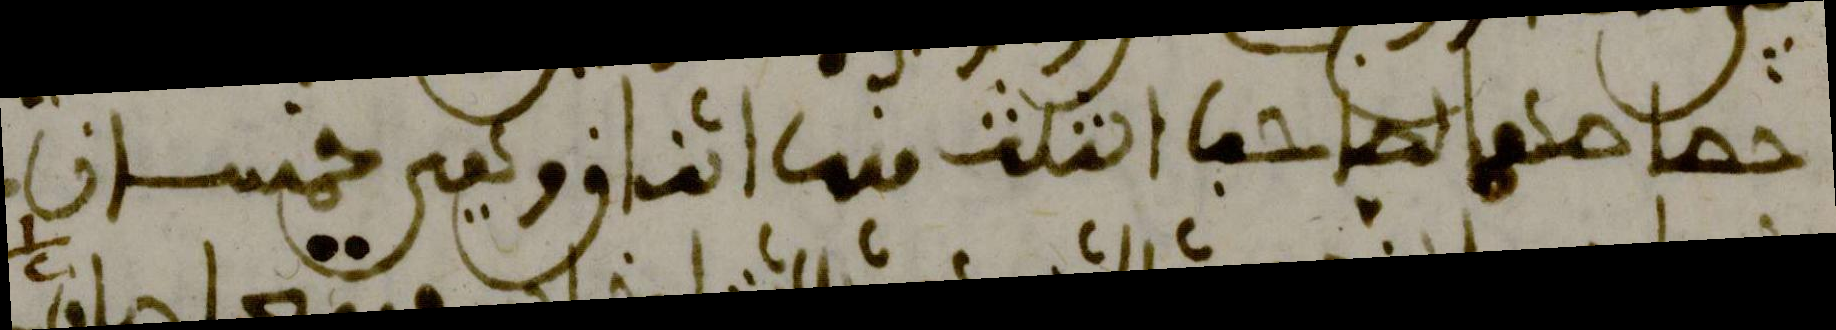حصاصهما لصاحب اثلث منها اثنان وهي خمسان
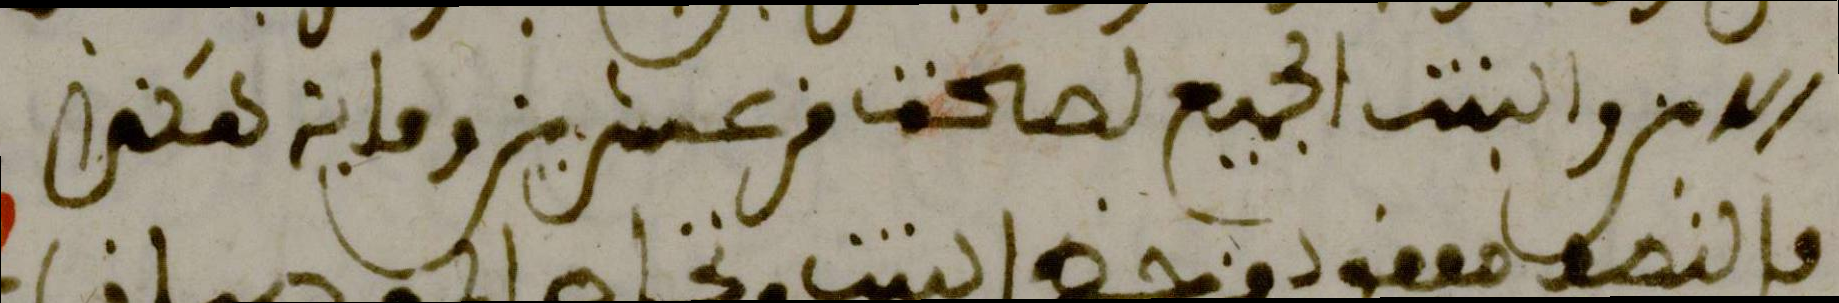الابن والبنت الجميع لصحت منعشرين وماية هكذا
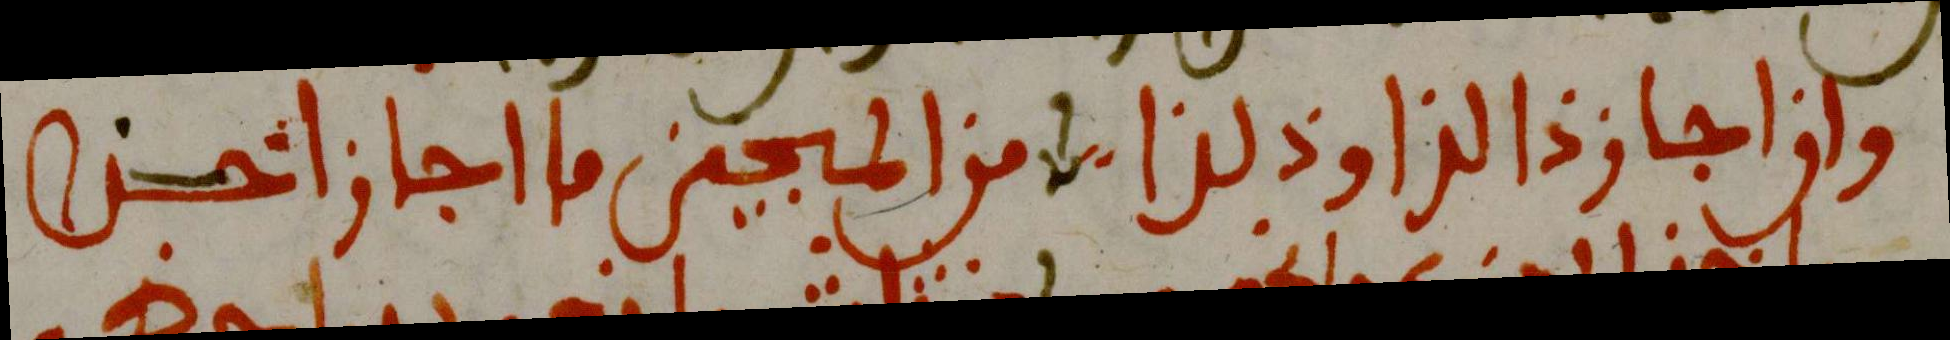وان اجار ذا لذا وذا لذا من المجيز ما اجاز اخذا
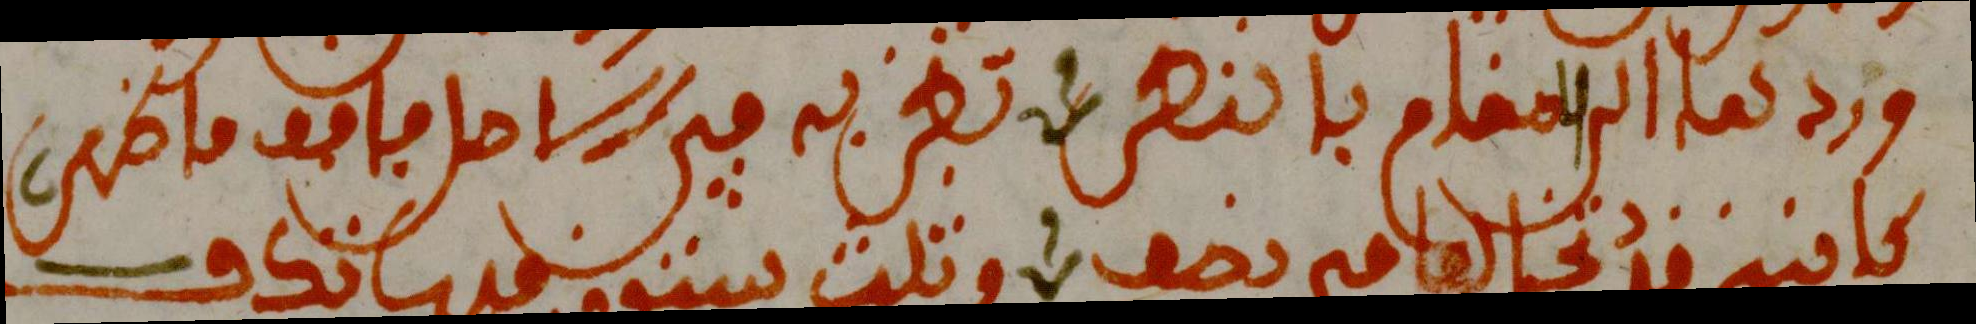وردها الى مقام بالنظر تظر به في الاصل فاقف ما ظهر
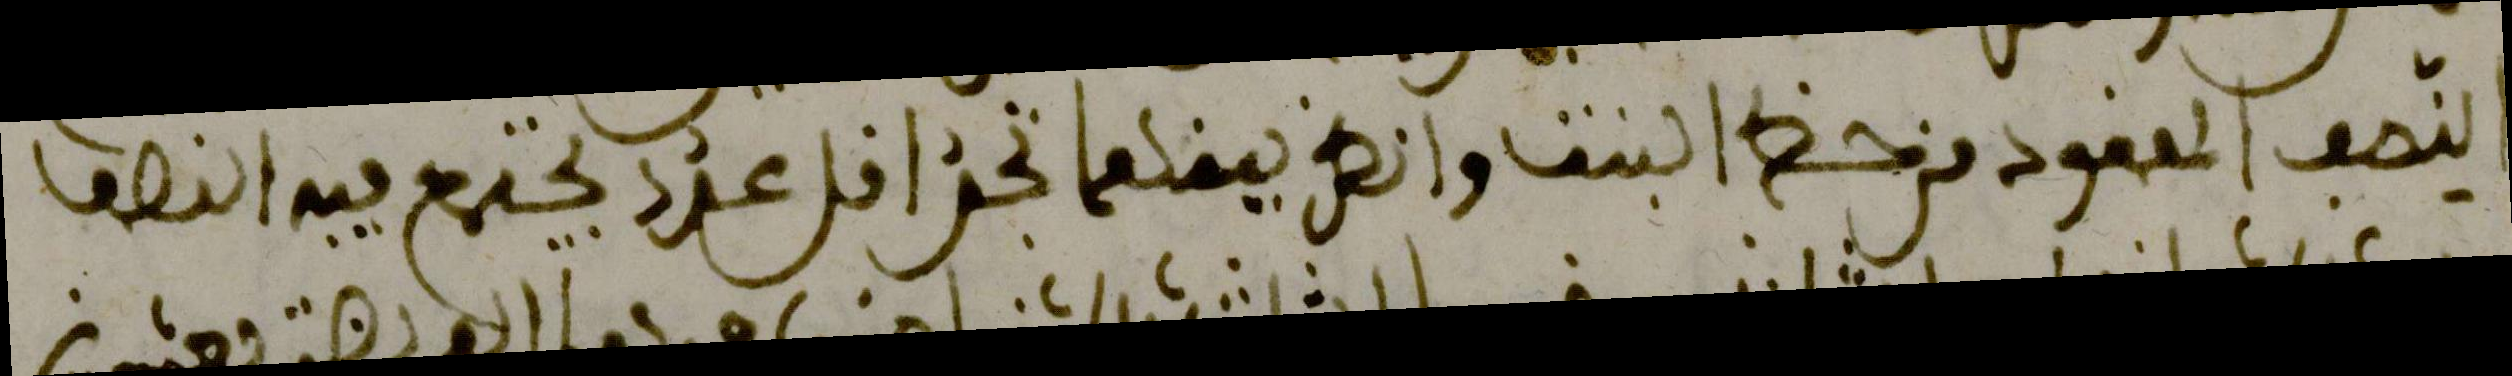النصف المفقود من حظ البنت وانظر بينهما تجد اقل عدد يجتمع فيه النصف
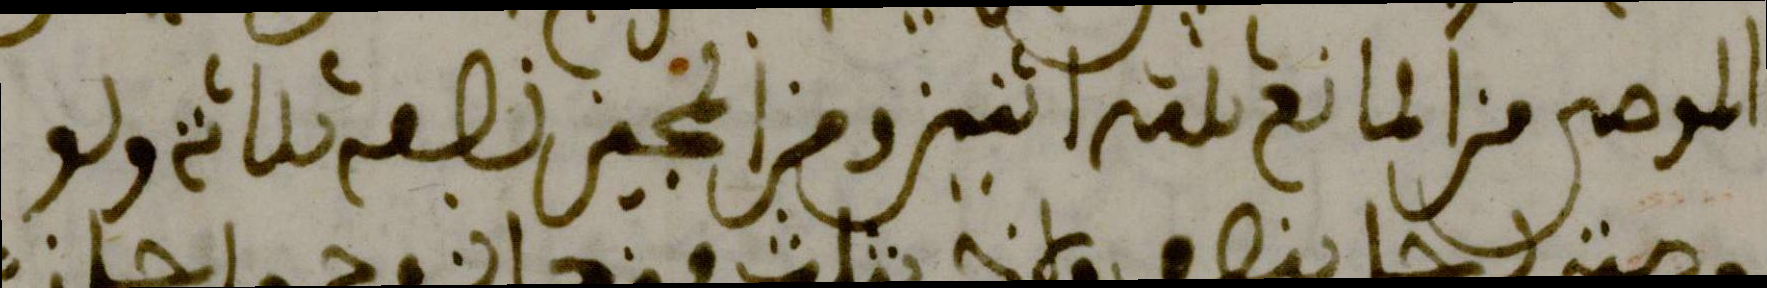الموصى من المانع ثلثه اثنين ومن المجيز نصفه ثلاثة ولو
